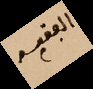الفقيه
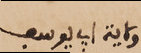ولاية ابي يوسف
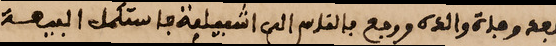بعد وفاة والده ورجع بالناس الى اشبيلية فاستكمل البيعة
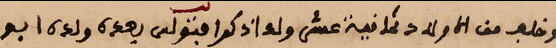وخلف من الاولاد ثمانية عشر ولدا ذكرا فتولى بعده ولده ابو
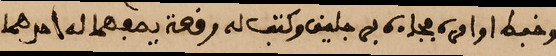وخبط اوامره فجاءه برجلين وكتب له رقعة يصفهما له احدهما
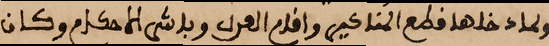ولما دخلها قطع المناكير واقام العدل وباشر الاحكام وكان
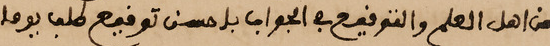من اهل العلم والتوقيع في الجواب باحسن توقيع طلب يوما
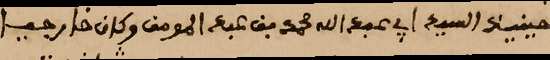حينيذ السيد ابي عبد الله محمد بن عبد المومن وكان خارجيا
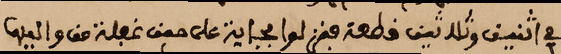في اثنين وثلاثين قطعة فنزلوا بجاية على حسن غفلة من واليها
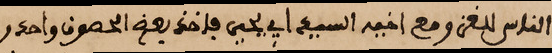الناس للغزو مع اخيه السيد ابي يحيى فاخد بعض الحصون واحدر
